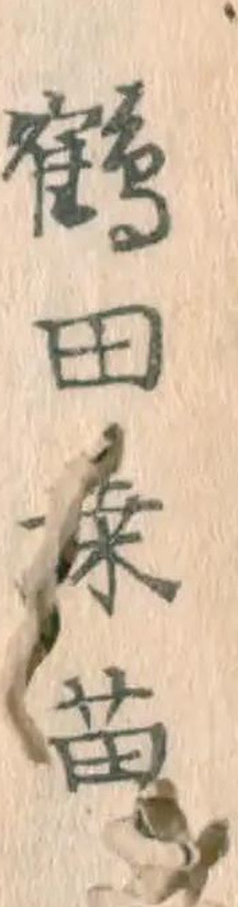鶴田桑苗
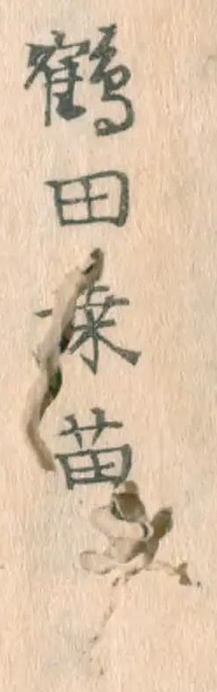鶴田桑苗
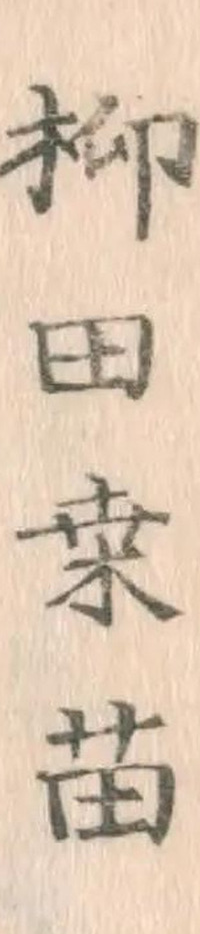柳田桑苗
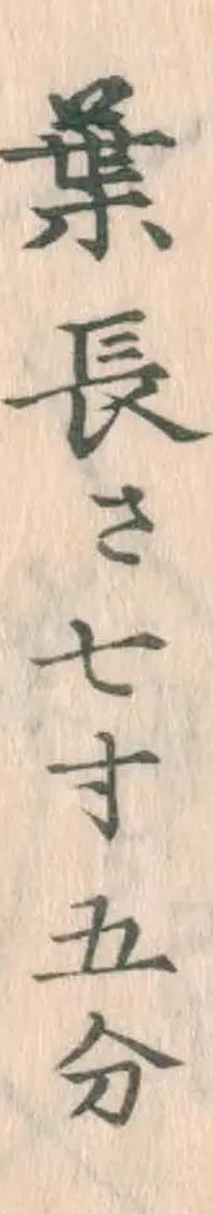葉長さ七寸五分

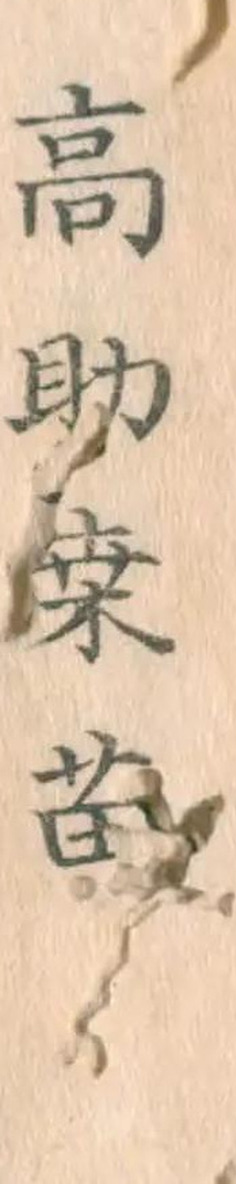高助桑苗
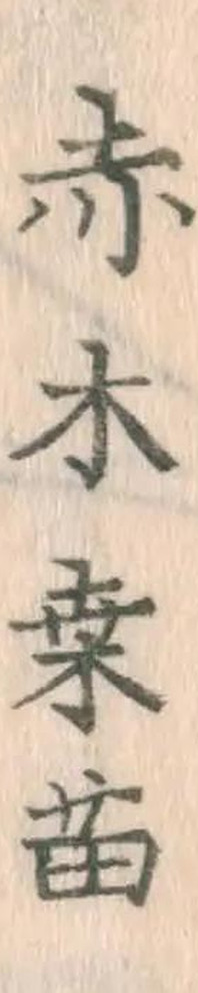赤木桑苗
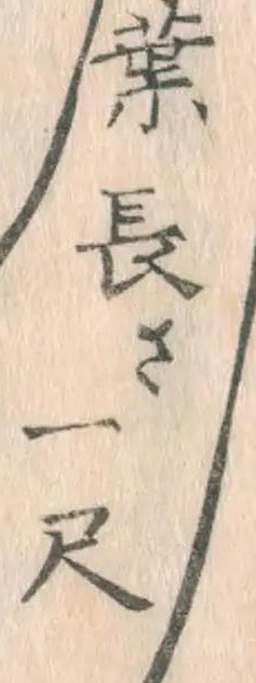葉長さ一尺

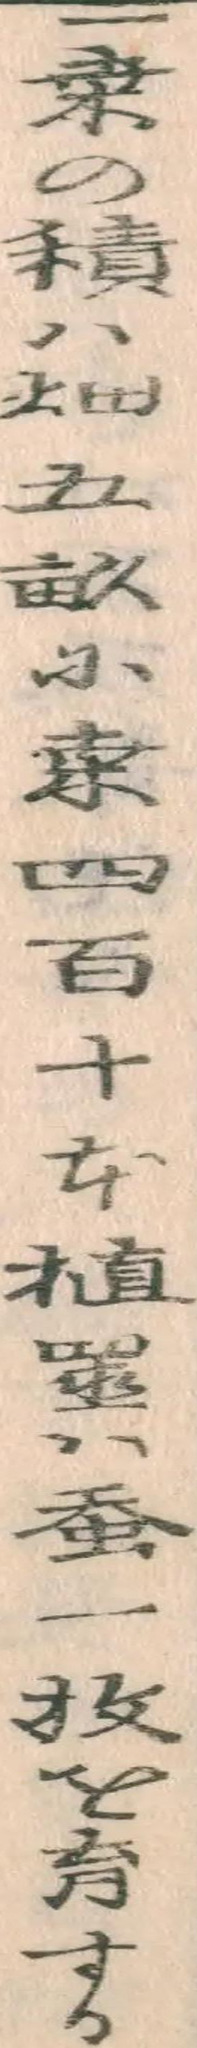一桑の積は畑五畝に桑四百十本植置は蚕一枚を育する
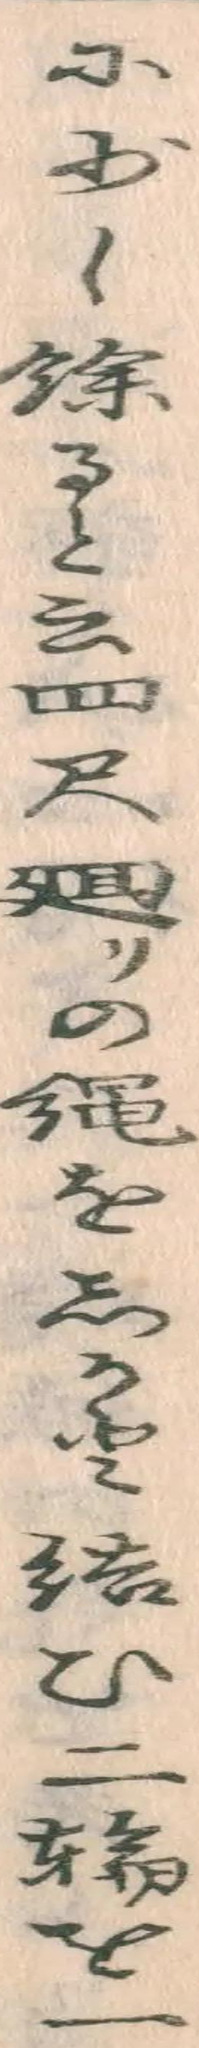に少し余ると云四尺廻りの縄をしかと結ひ二輪を一
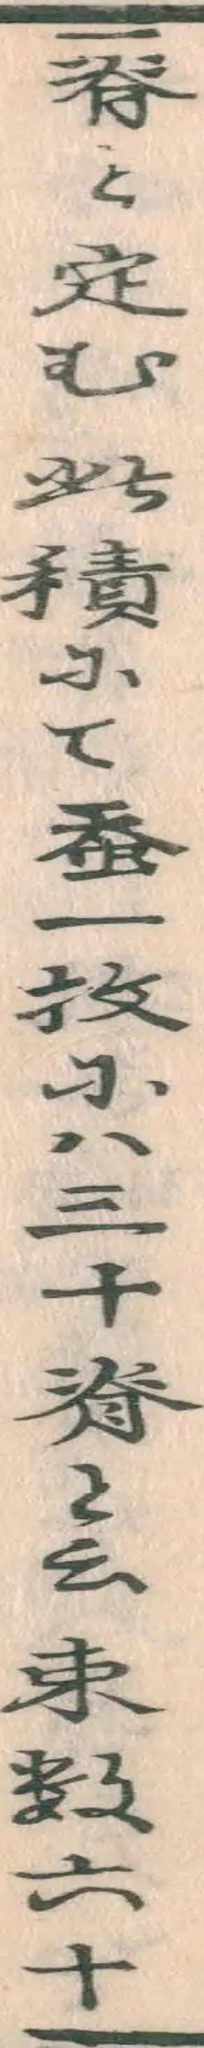一脊と定む此積にて蚕一枚には三十脊と云束数六十
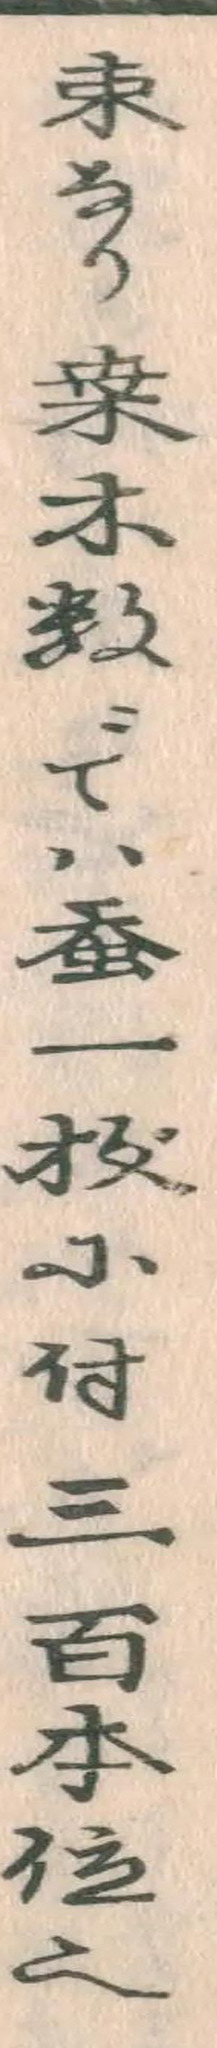束なり桑木数にては蚕一枚に付三百本位也
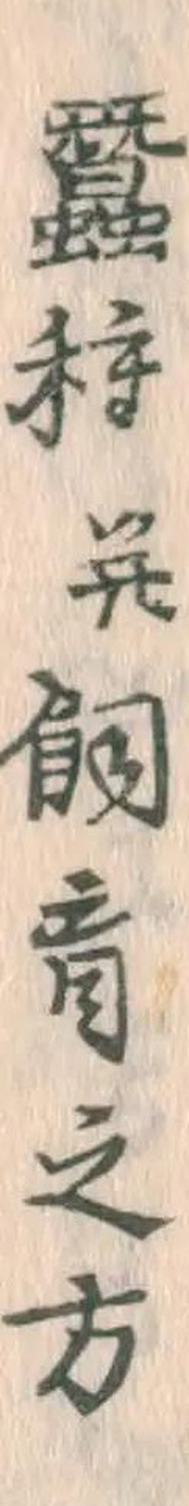蚕種幷飼育之方
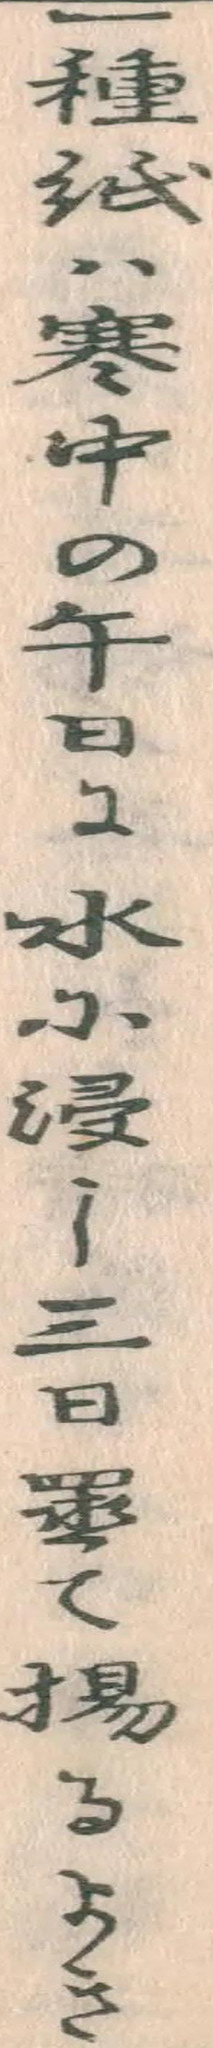一種紙は寒中の午日に水に浸し三日置て揚るよき
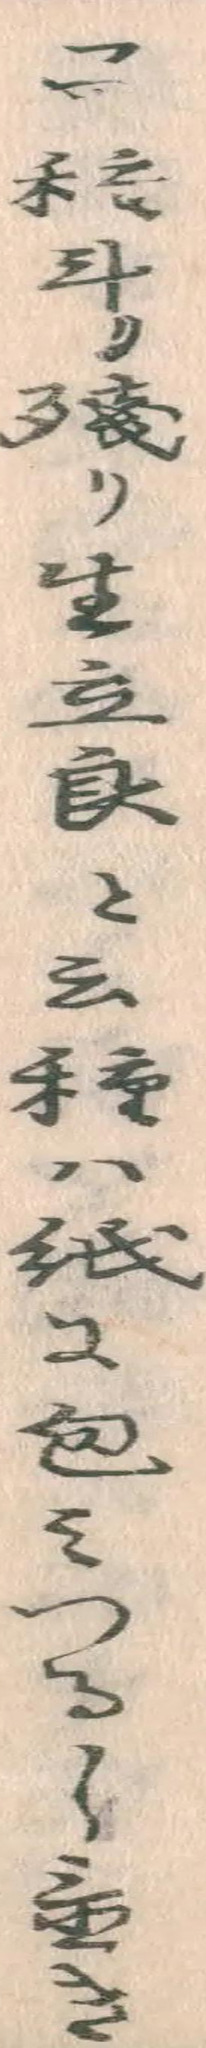子種斗り残り生立良と云種は紙に包みつるし置き
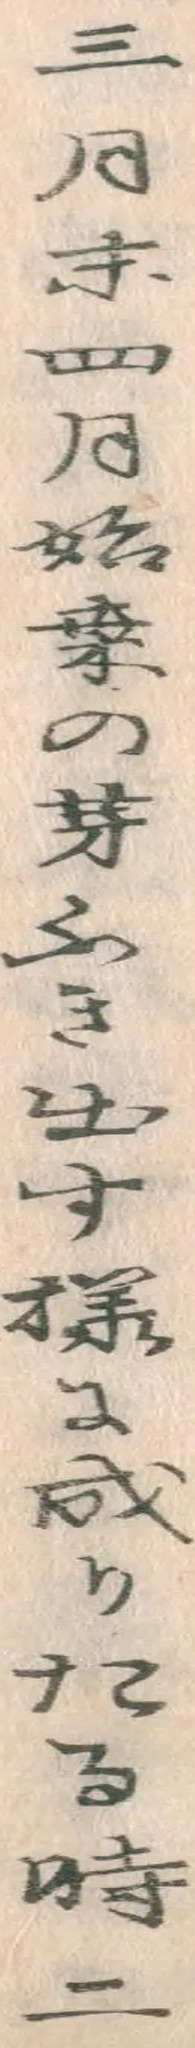三月末四月始桑の芽ふき出す様に成りたる時二
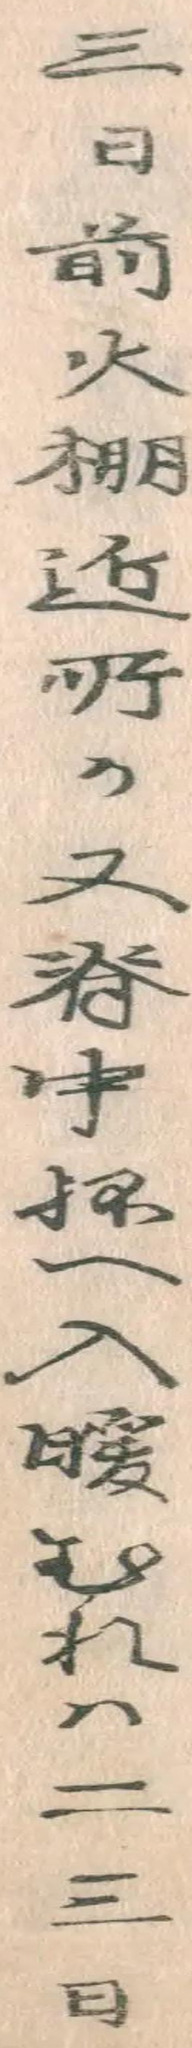三日前火棚近所か又脊中抔へ入暖むれは二三日
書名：機織彙編 5巻. [1]
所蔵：国立国会図書館 National Diet Library, JAPAN
